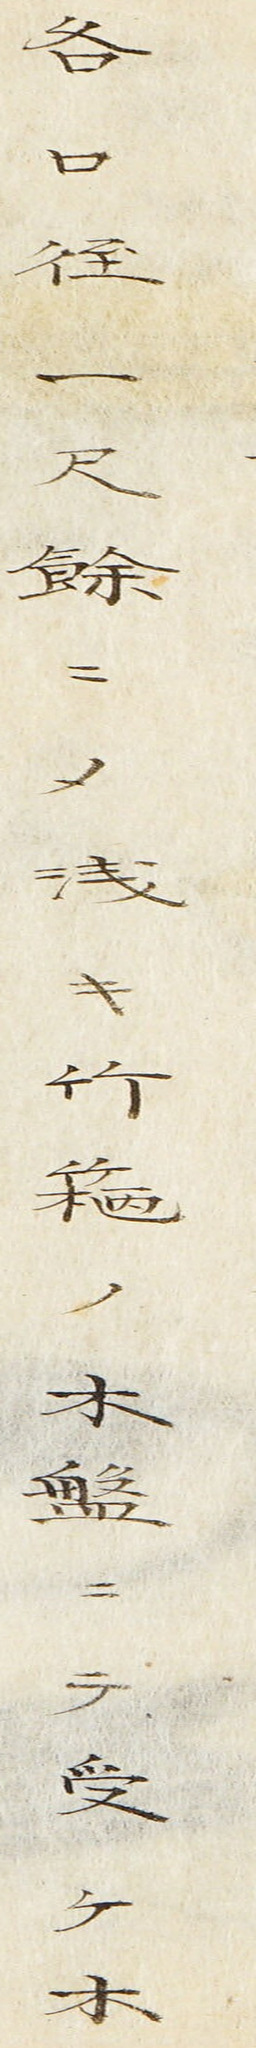各口径一尺余ニシテ浅キ竹ノ木盤ニテ受ケ木
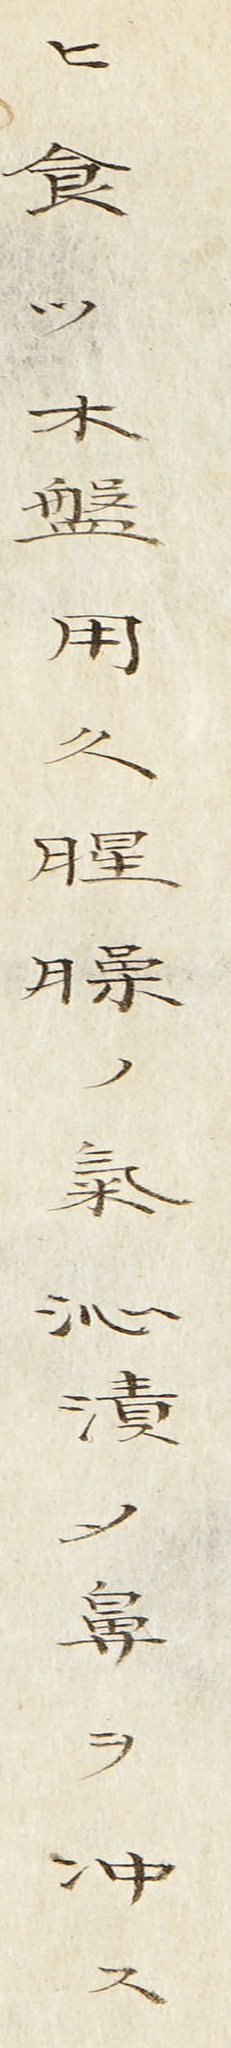ヒ食ツ木盤用久腥臊ノ気沁漬シテ鼻ヲ冲ス

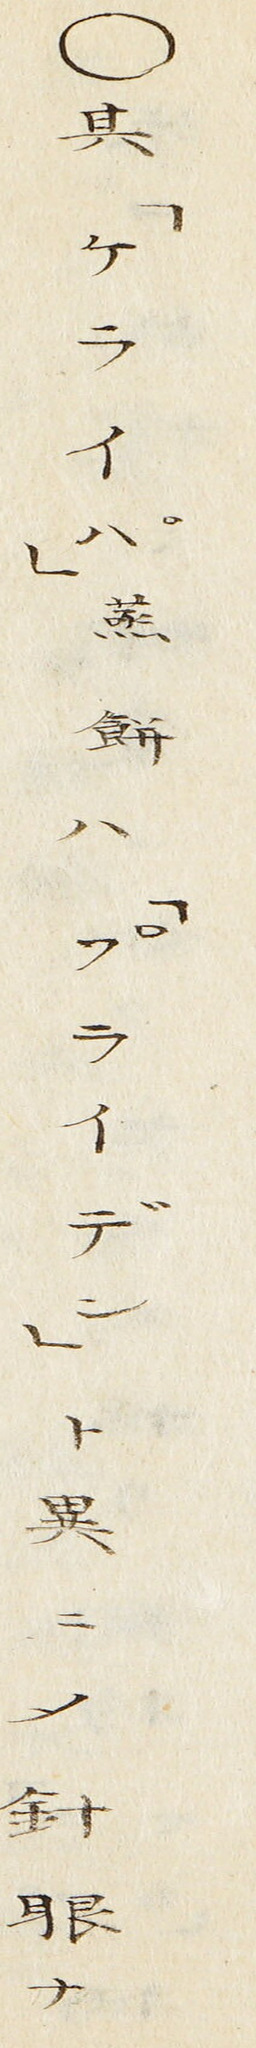〇其「ケライパ」蒸餅ハ「プライデン」ト異ニシテ針眼ナ
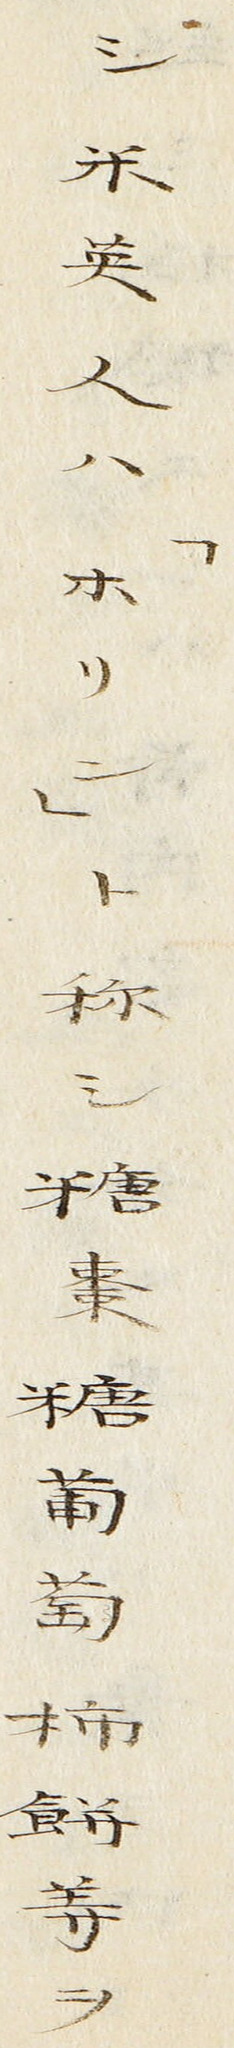シ米英人ハ「ホリン」ト称シ糖棗糖葡萄柿餅等ヲ
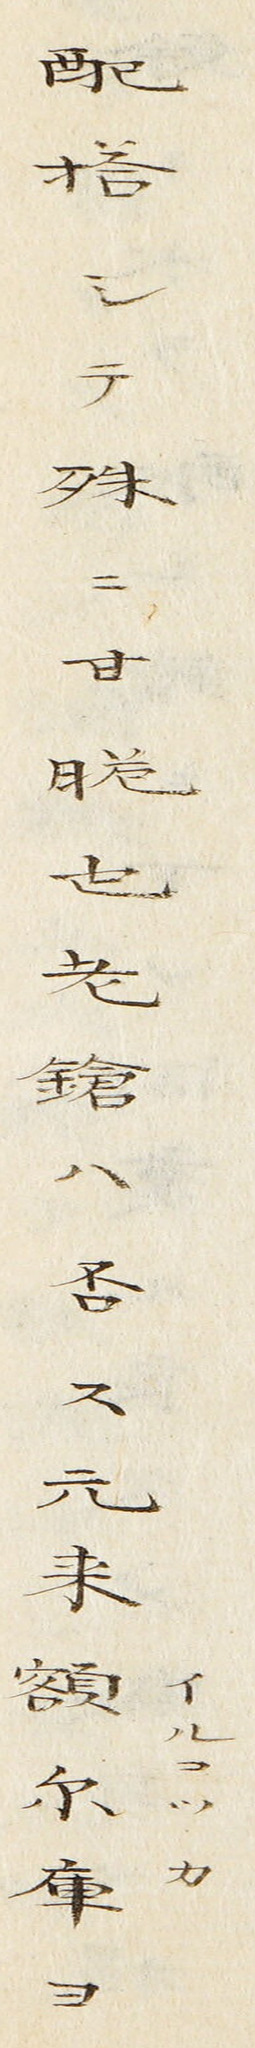配撘？シテ殊ニ甘也老鎗ハ否ス元来額尓庫ヨ
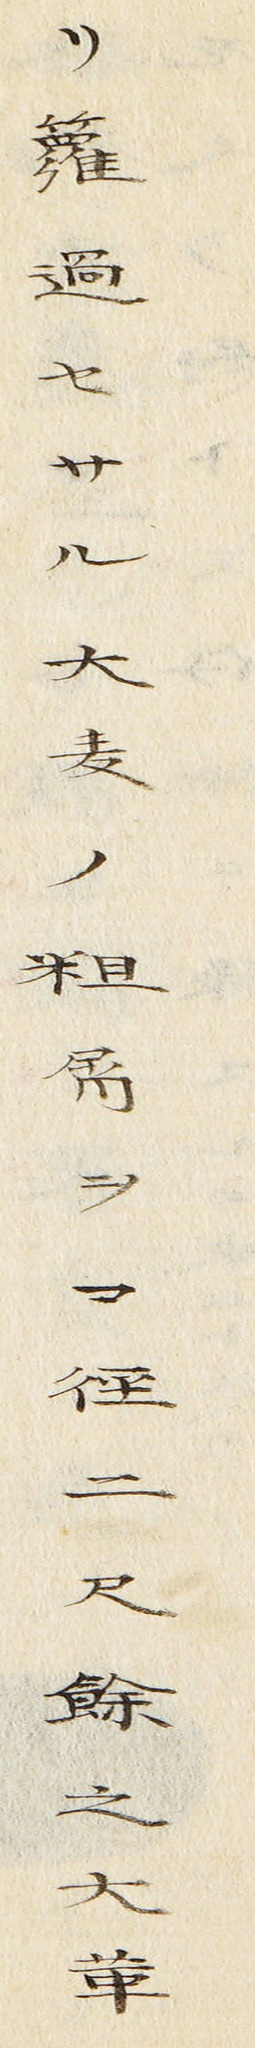リ籮過セサル大麦ノ粗屑ヲマ径二尺余之大革
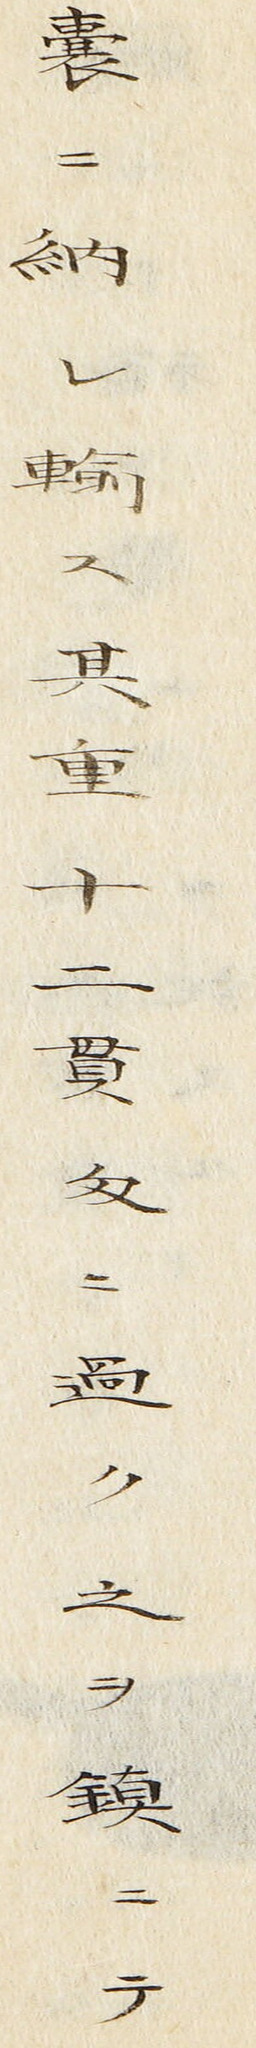嚢ニ納レ輸ス其重十二貫匁ニ過ク之ヲ鎮ニテ
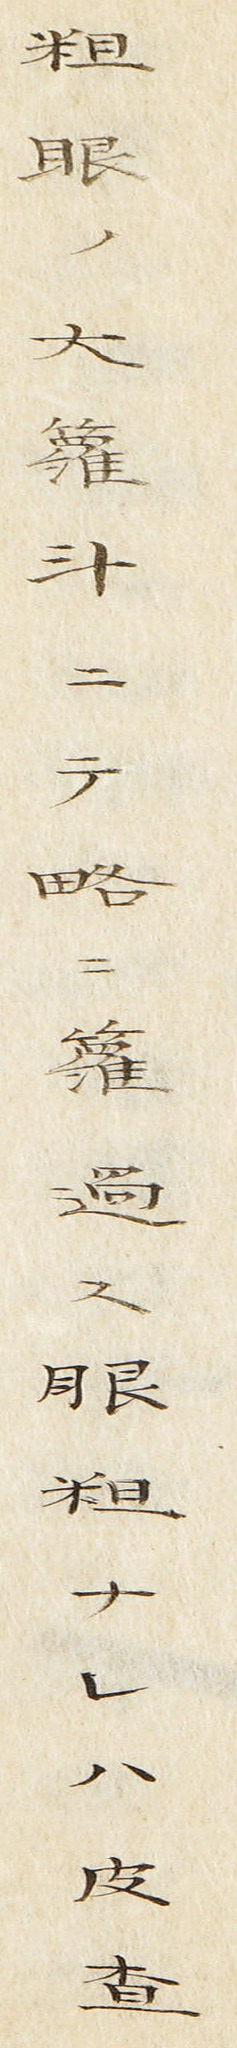粗眼ノ大籮斗ニテ略ニ籮過ス眼粗ナレハ皮査
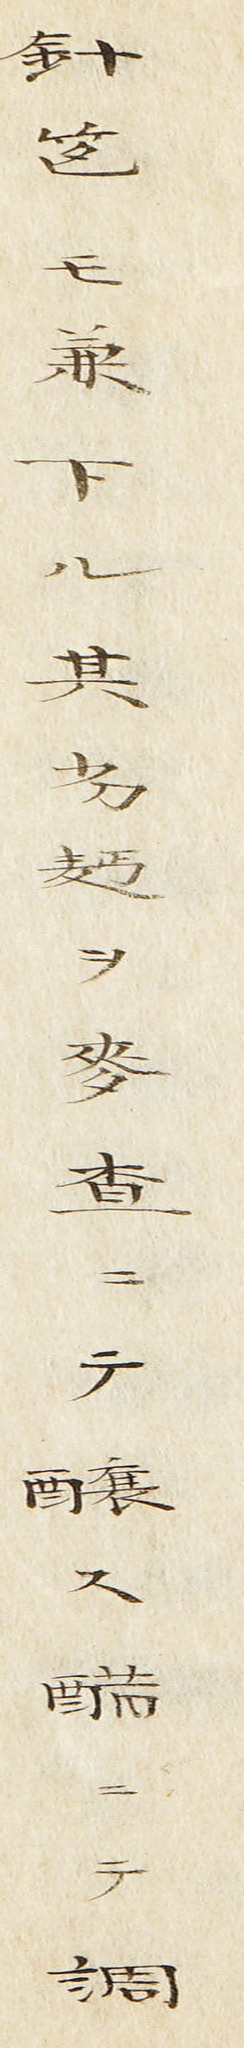針モ兼下ル其劣麺ヲ麦査ニテ醸ス醋ニテ調
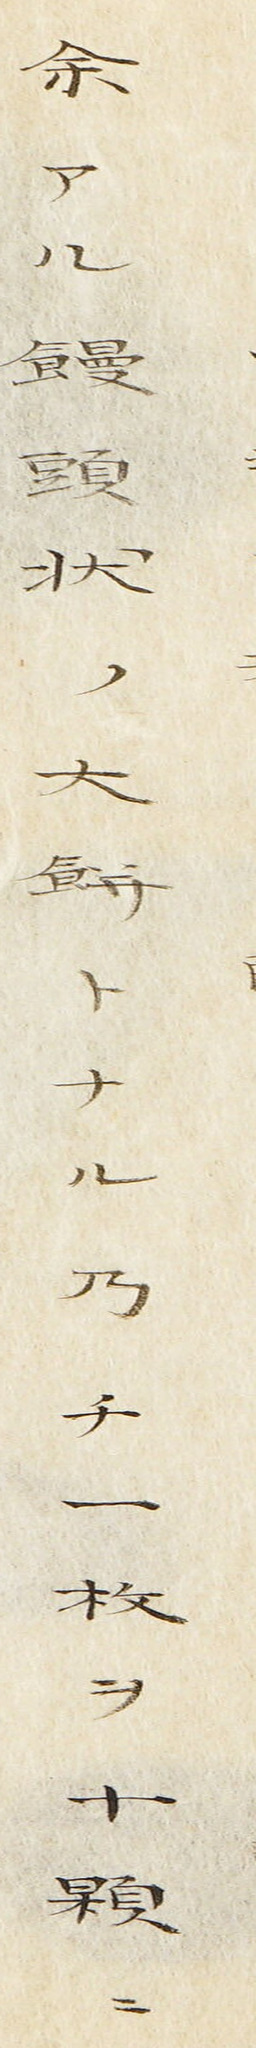余アル饅頭状ノ大餅トナル乃チ一枚ヲ十顆ニ
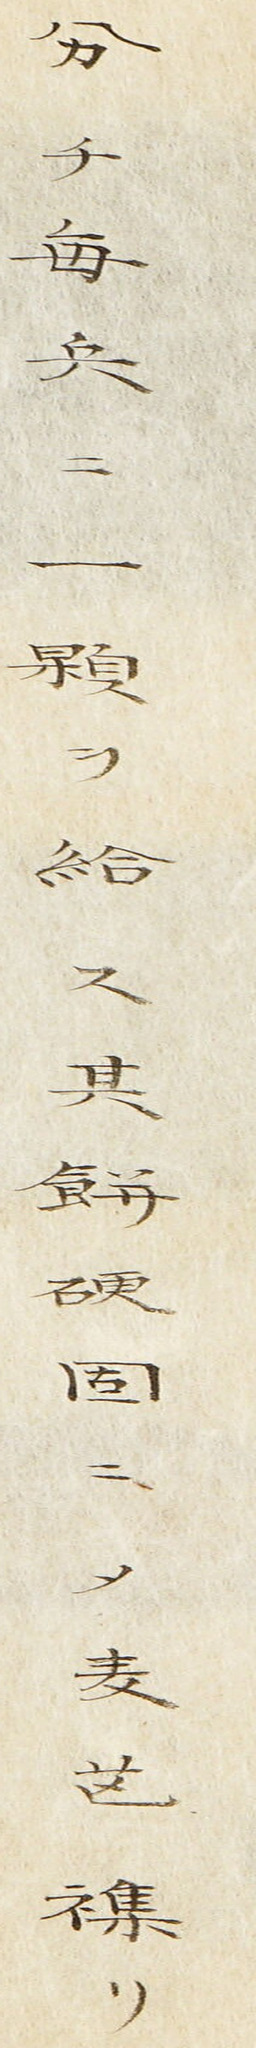分チ毎兵ニ一顆ヲ給ス其餅硬固ニシテ麦雑リ
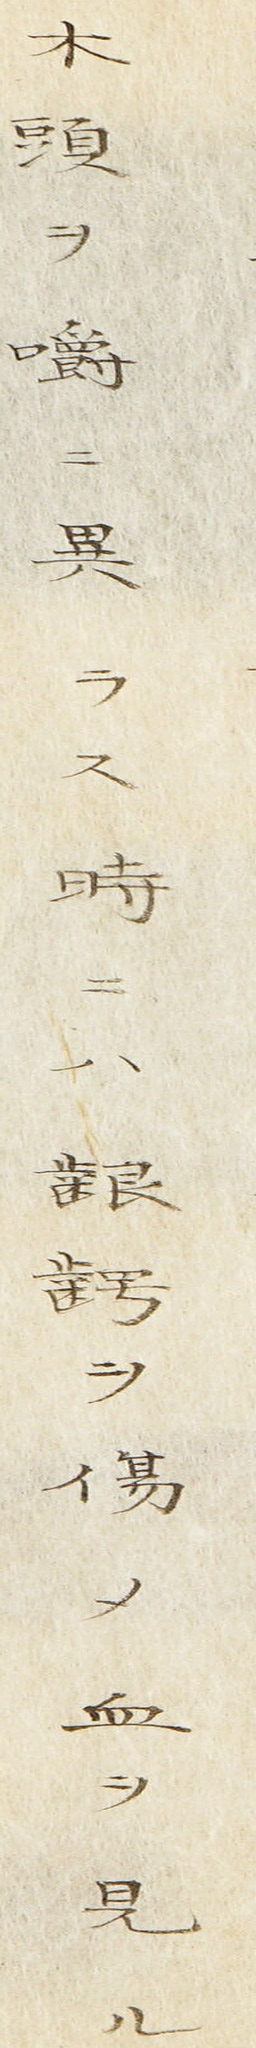木頭ヲ嚼ニ異ラス時ニハヲ傷シテ血ヲ見ル
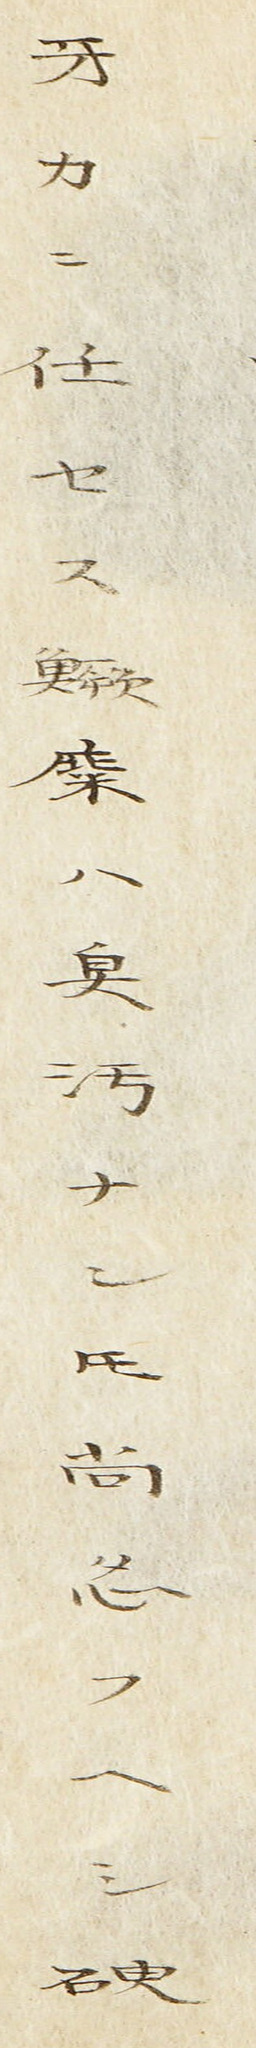牙カニ任セス鱖糜？ハ臭汚ナレドモ尚忍？フヘシ硬
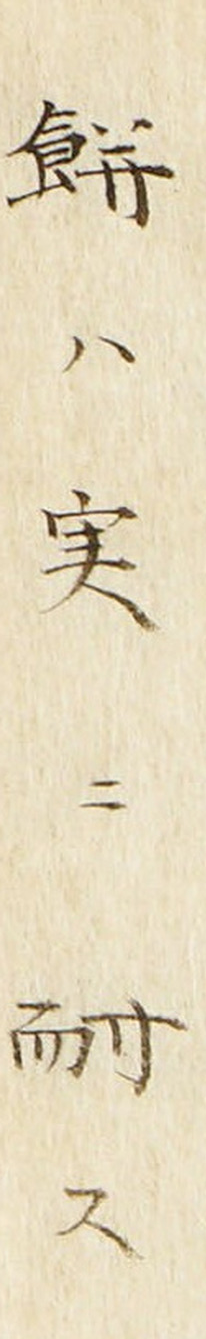餅ハ実ニ耐ス

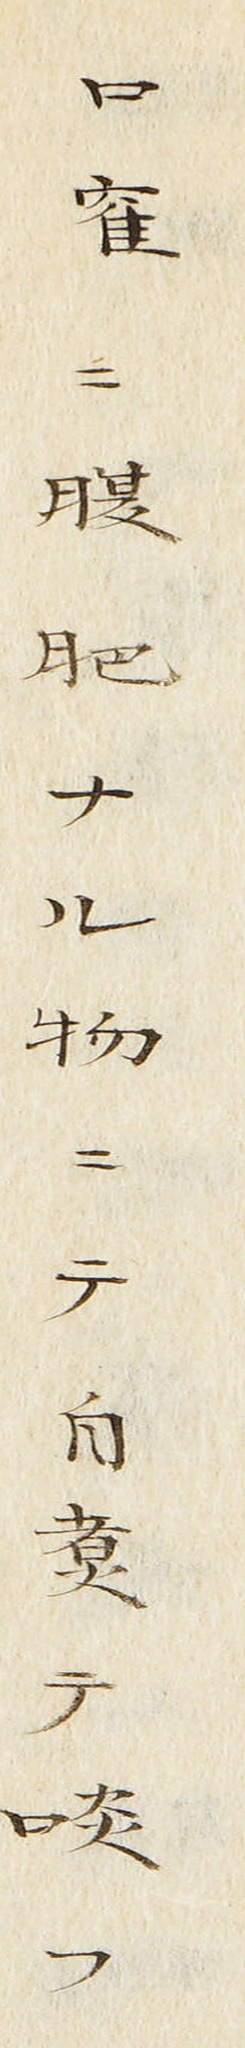口ニ腹肥ナル物ニテ自煮テ啖フ
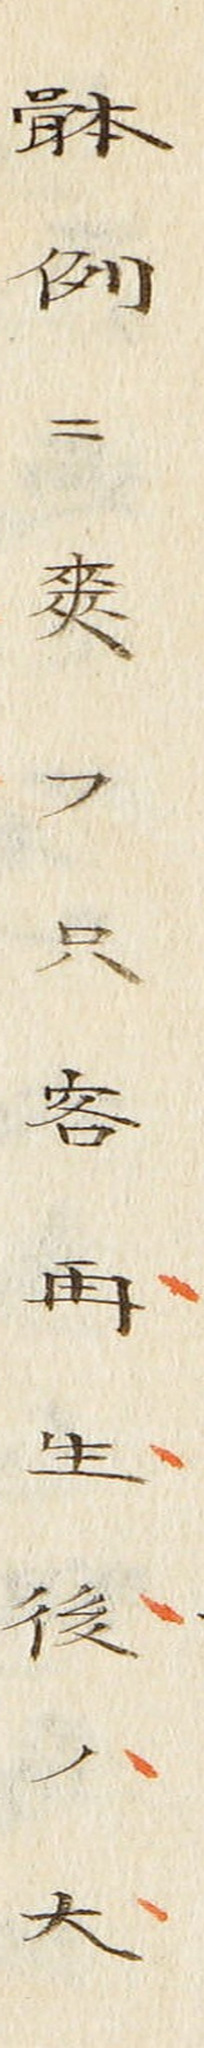体例ニ爽？フ只客再生後ノ大
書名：蕃談
